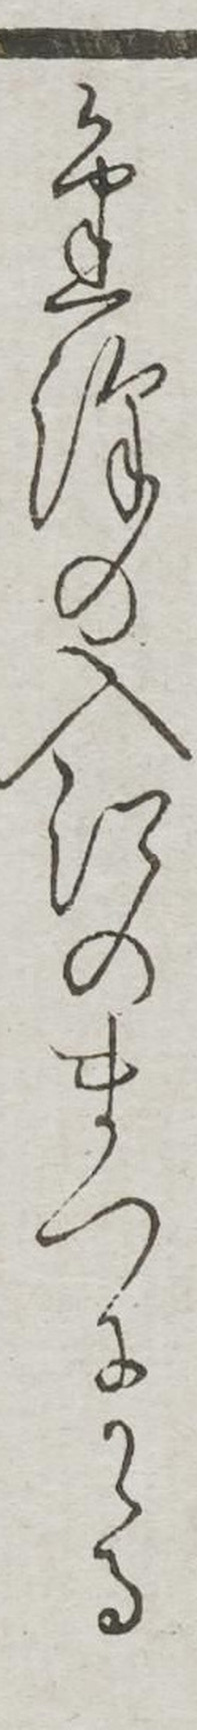金澤の入江のまつにかゝる小柴
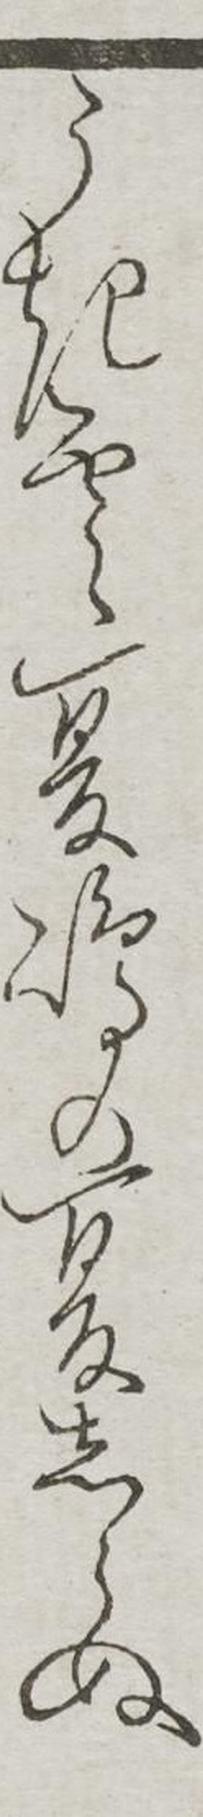うき雲夏嶋の夏しらぬ
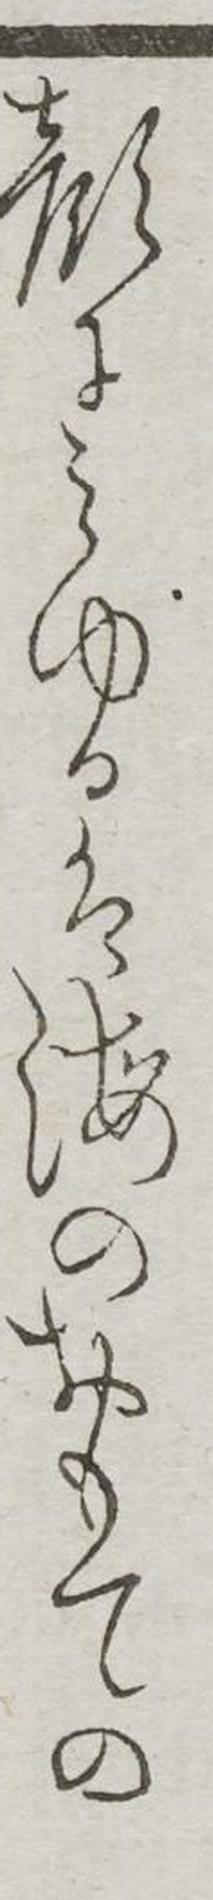顔にみゆるは海のおもての
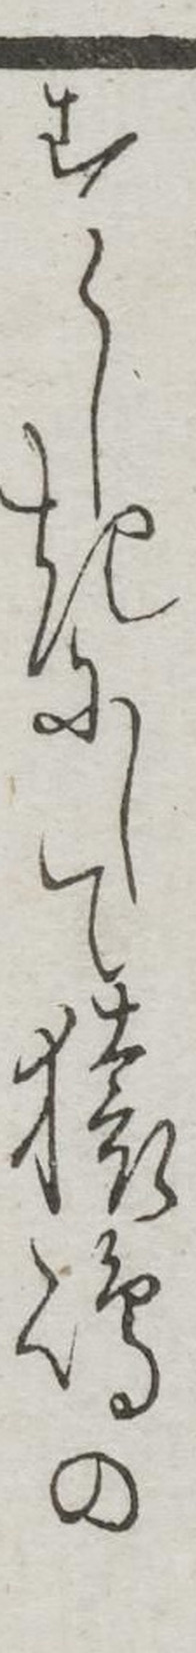すゝしきにして猿嶋の
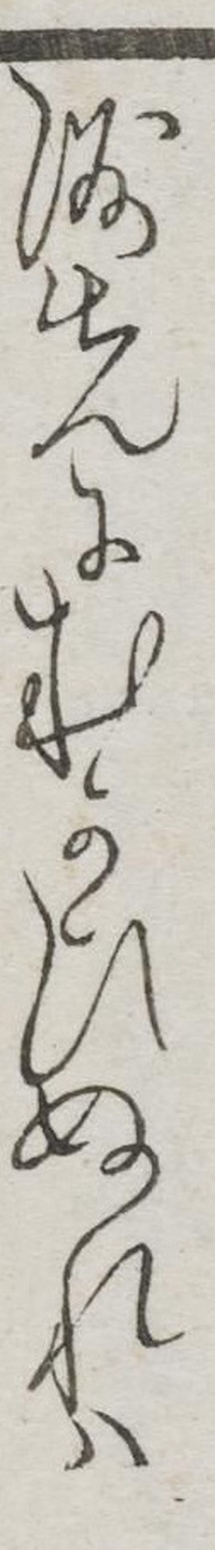淵先にむかひぬれは
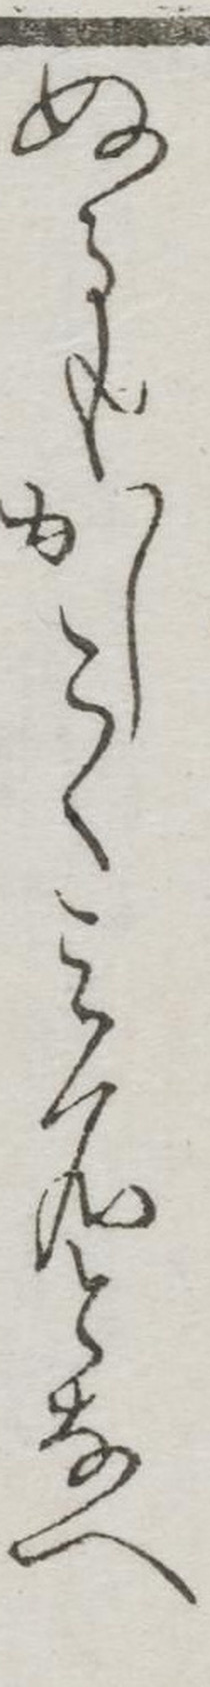ぬるもかしこくみ石となへ夏嶌
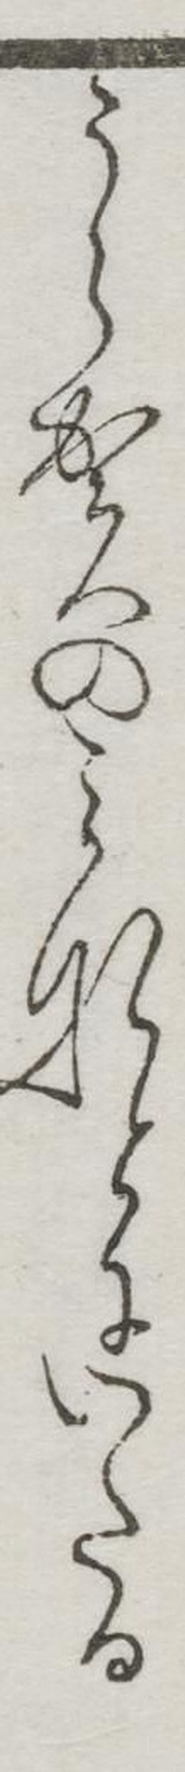うら賀のみなとにいたる
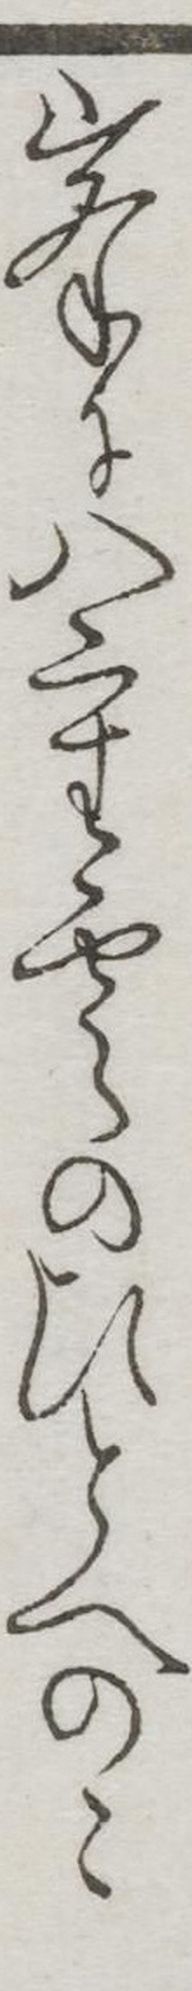峯に八重雲のひとへのこ
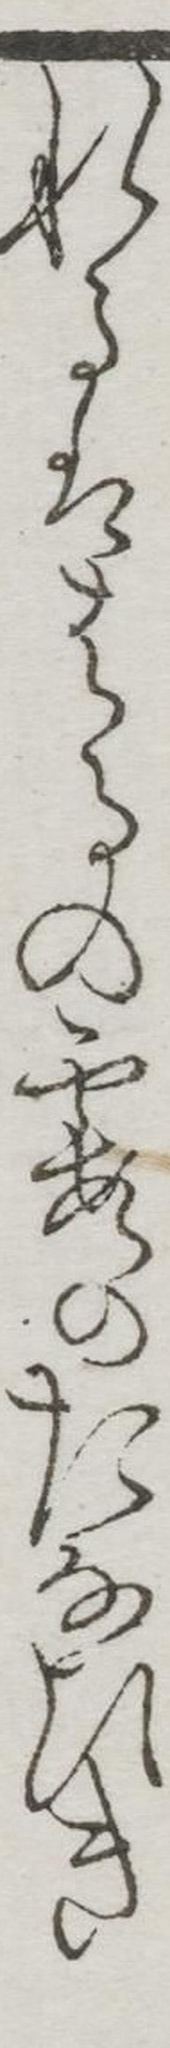れるははるの霞のたなひき
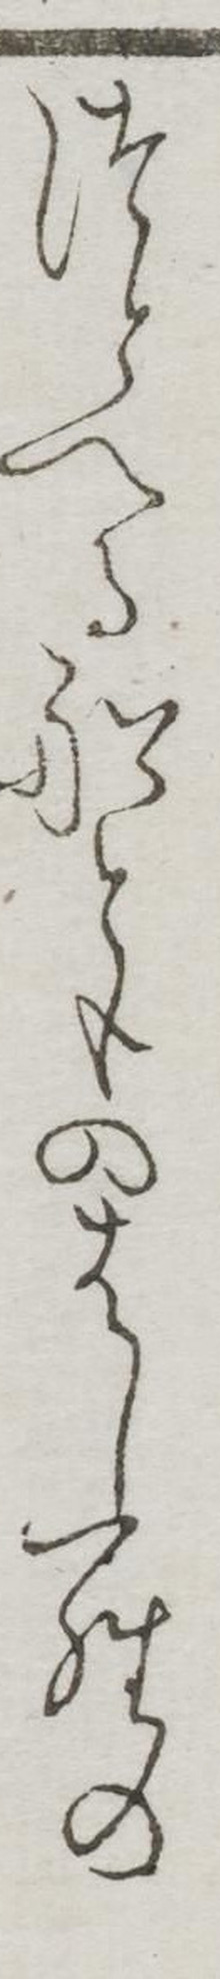つとへる船とものはしらの
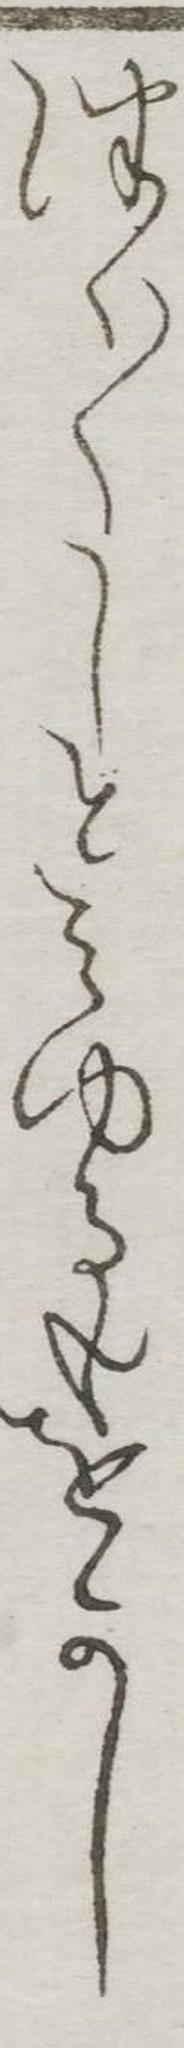つく〳〵しとみゆるもをかし

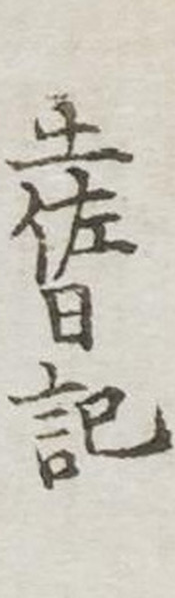土佐日記
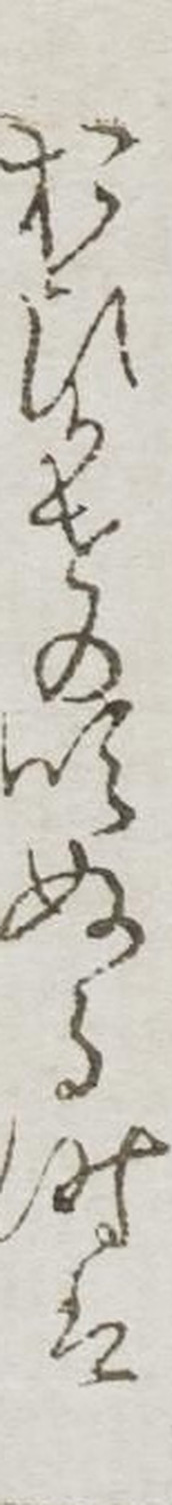おひかせの吹ぬる時は
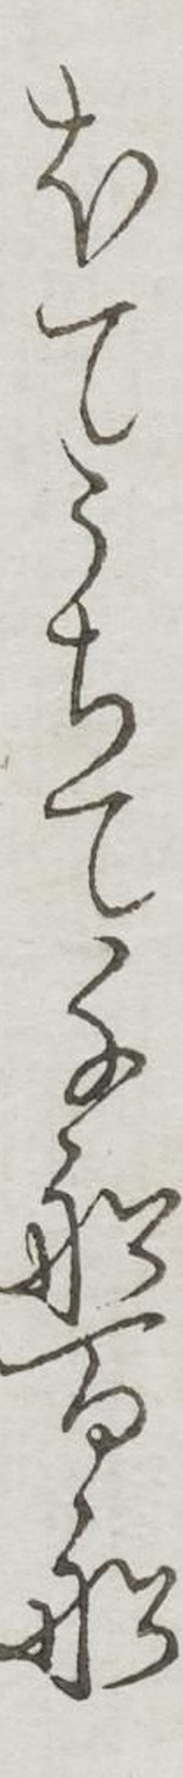ほてうちて千船百船
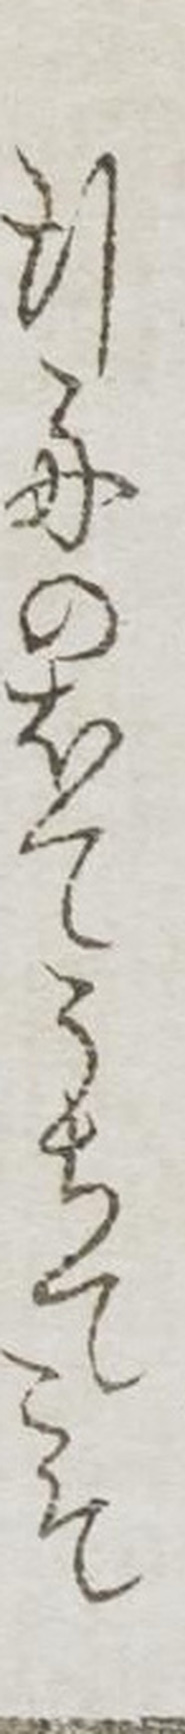行舟のほてうちてこそ
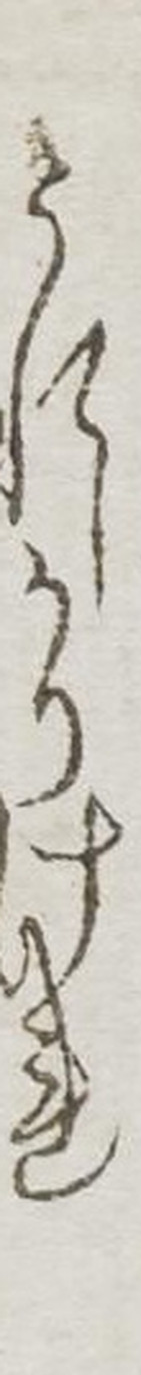うれしかりけれ
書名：挿画熱海日記　全
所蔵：東京大学地震研究所図書室 Earthquake Research Institute Library, The University of Tokyo, JAPAN
